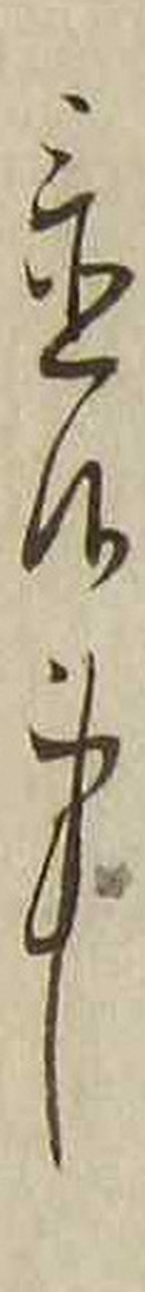置候事

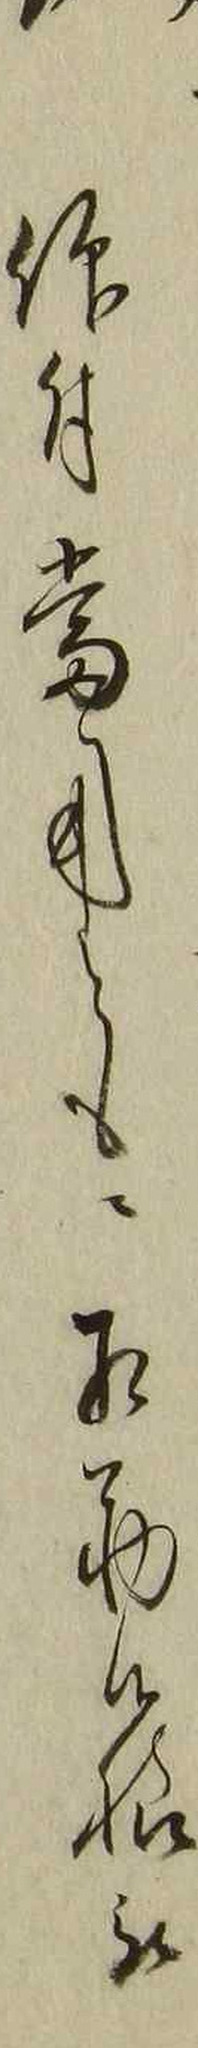被仰付当用ともニ相勤候様被
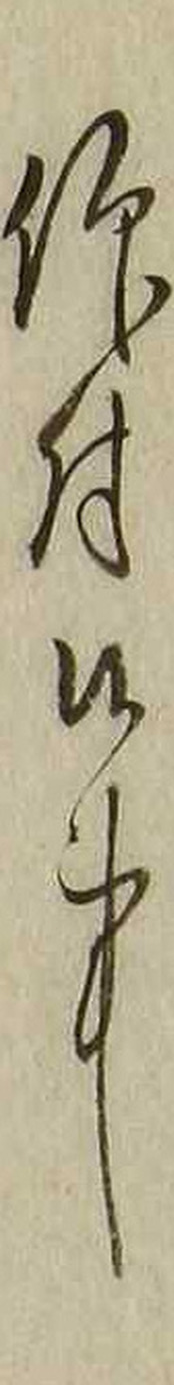仰付候事
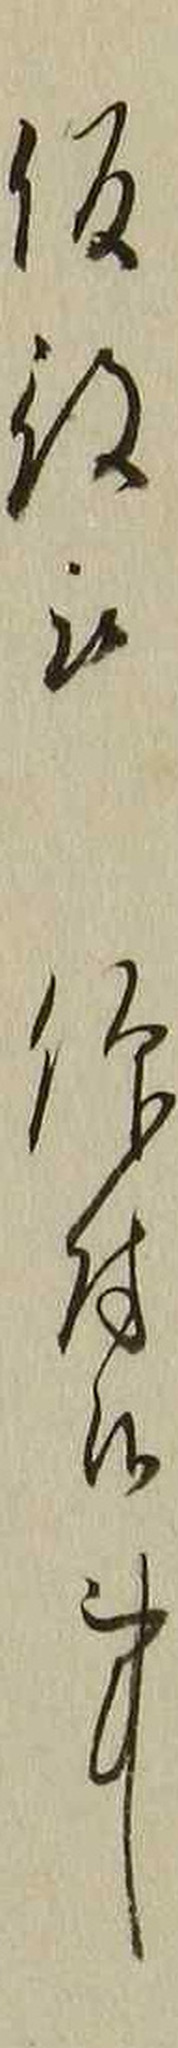仮役被仰付候事
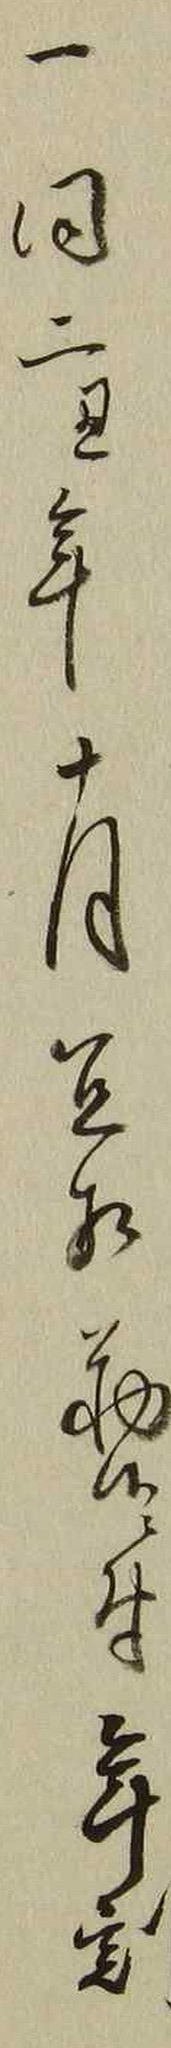一同二丑年十月宜相勤候ニ付年割
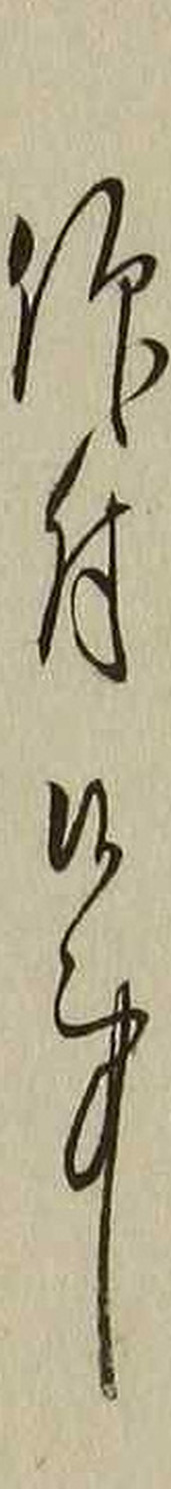仰付候事
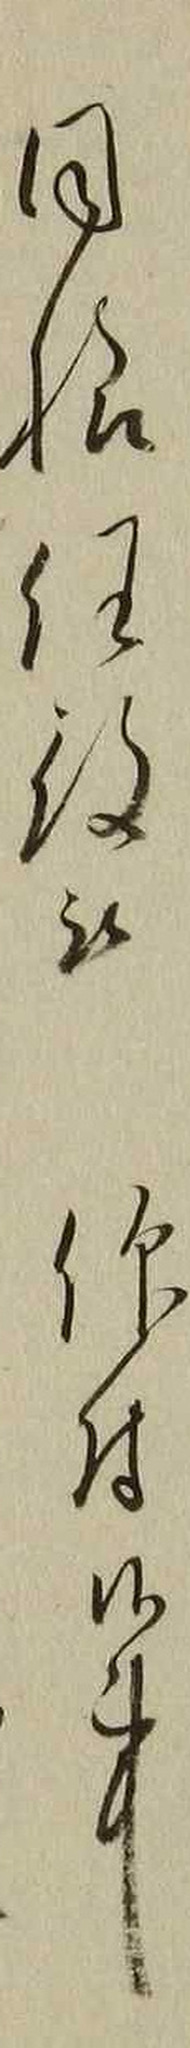同様任役被仰付候事
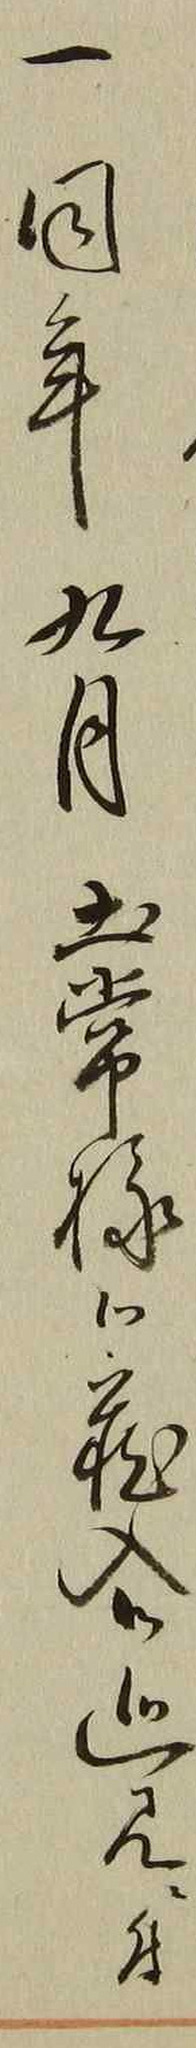一同年九月土常様御蔵入御巡見ニ付
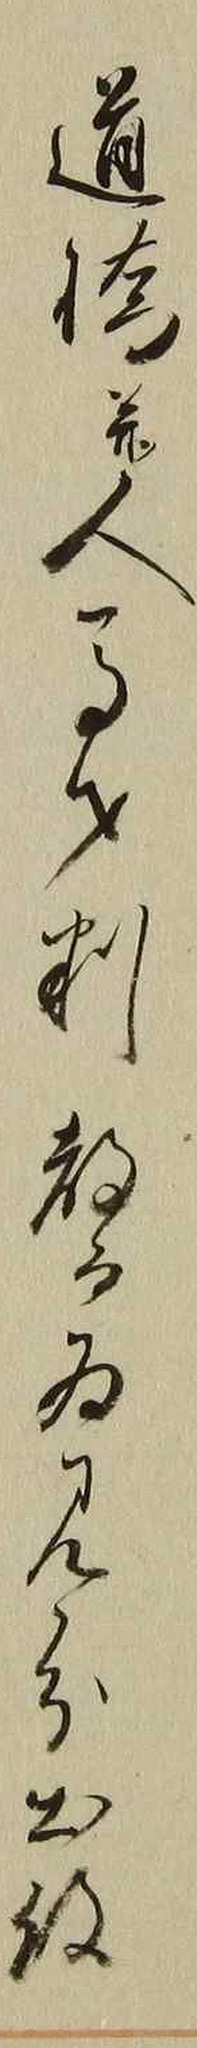道橋并人馬才判都而為見分出役
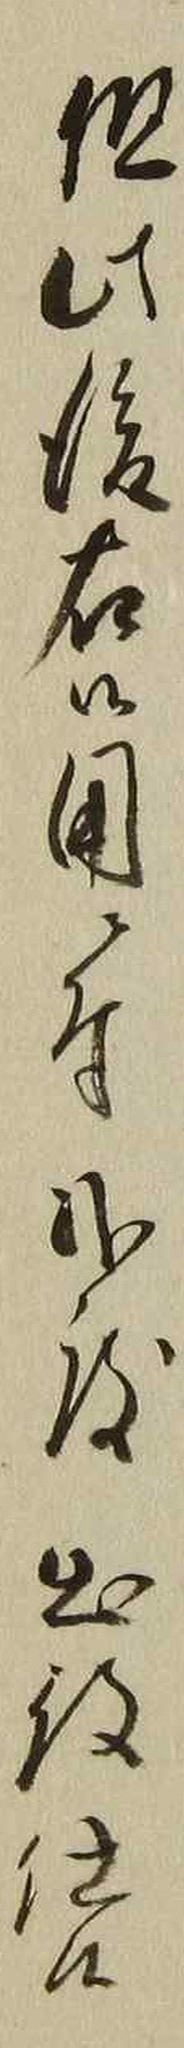但此後右御用ニ付弐度出役仕候
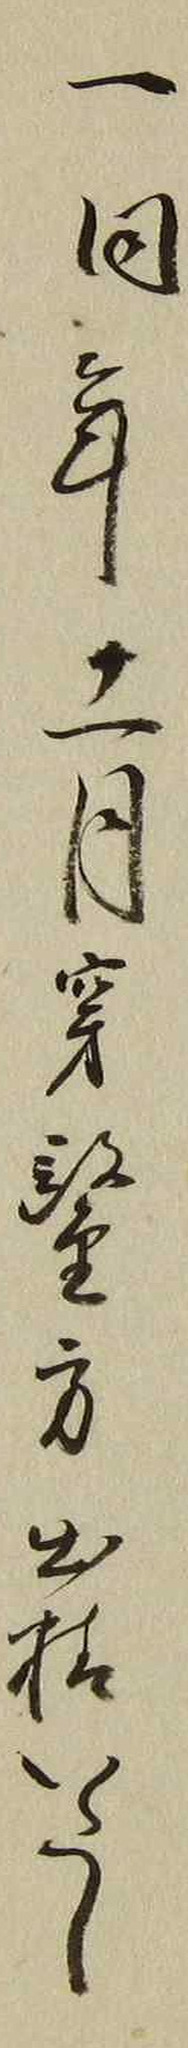一同年十一月穿鑿方出精いたし
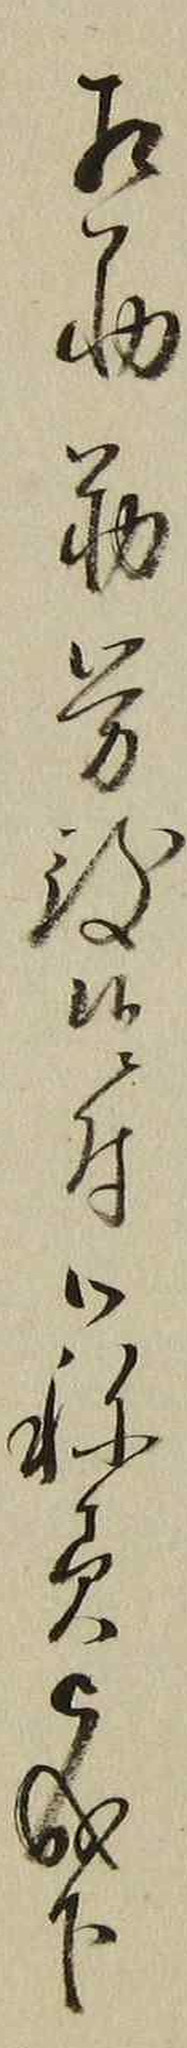相勤勤労致候ニ付御称美被成下
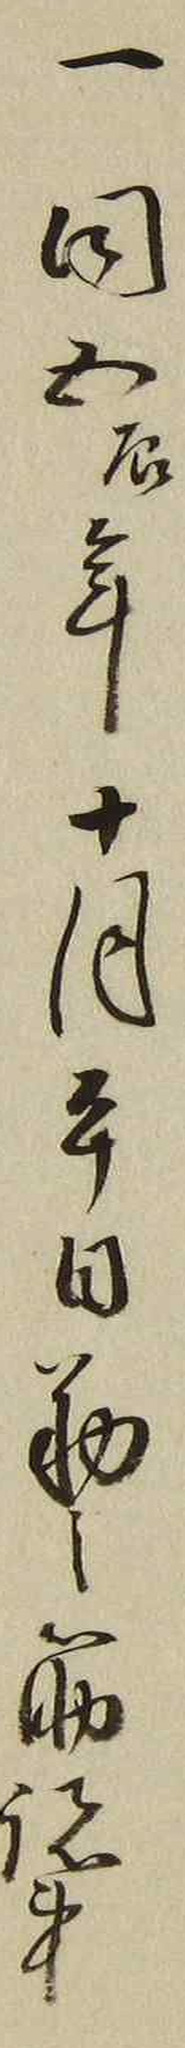一同五辰年十月平日勤之筋諸事
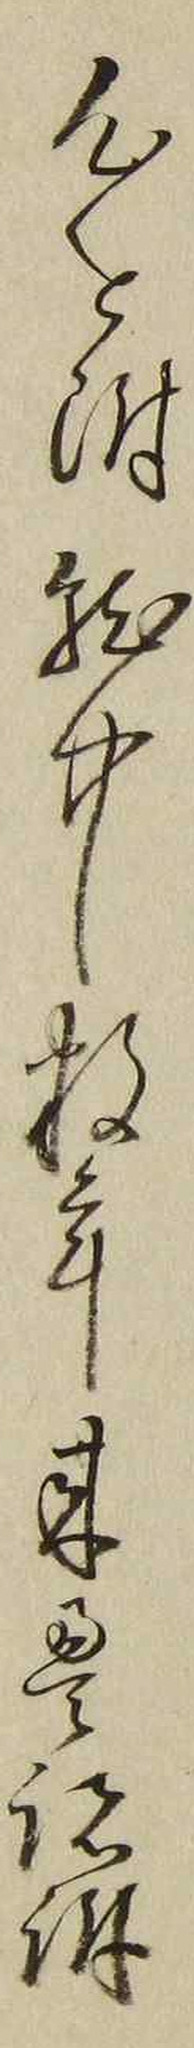心を附就中数年来畳諸訴
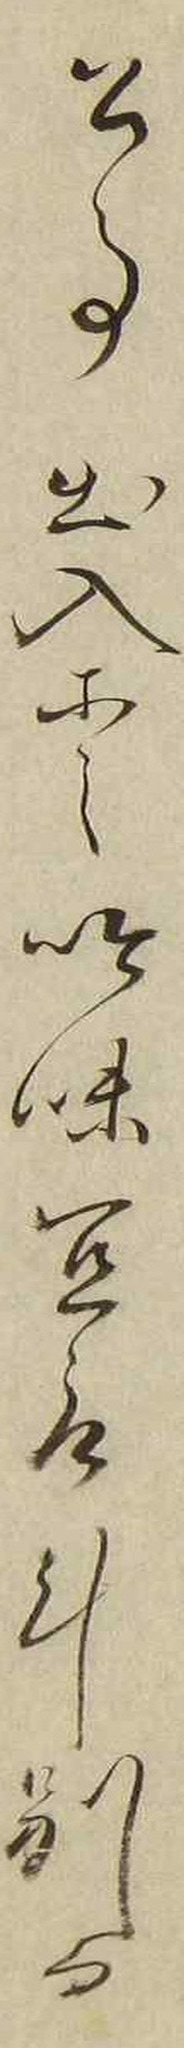公事出入等之吟味宜取計別而

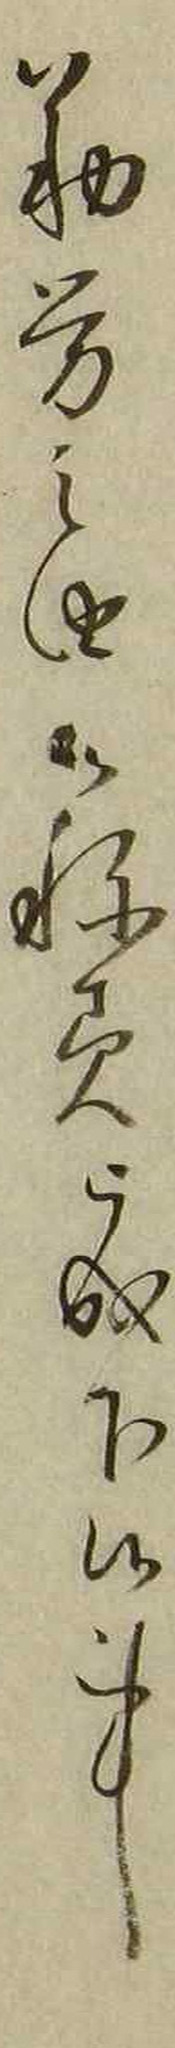勤労之由御称美被成下候事
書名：諸士系譜　巻之132　た之部8
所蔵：会津若松市立会津図書館
